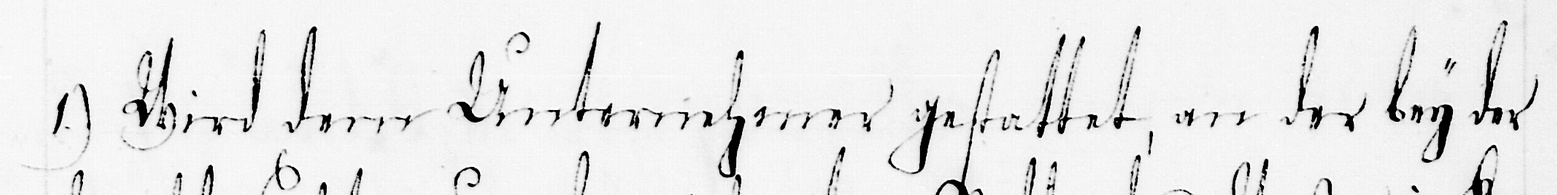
1.) Wird dem Unternehmer gestattet, an der bey der
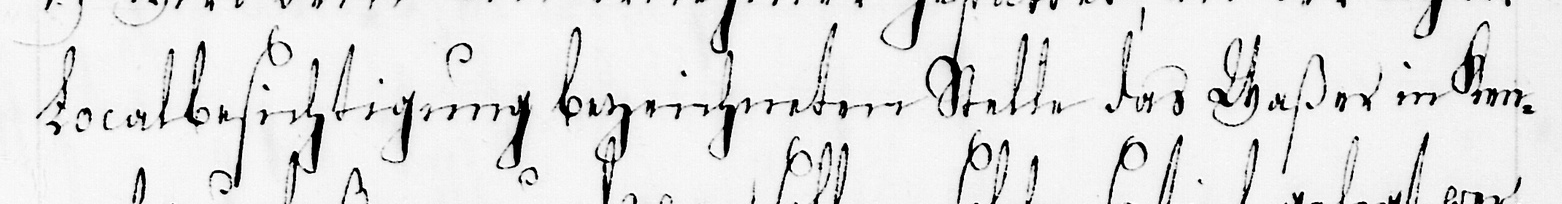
Localbesichtigung bezeichneten Stelle das Waßer in Ken¬
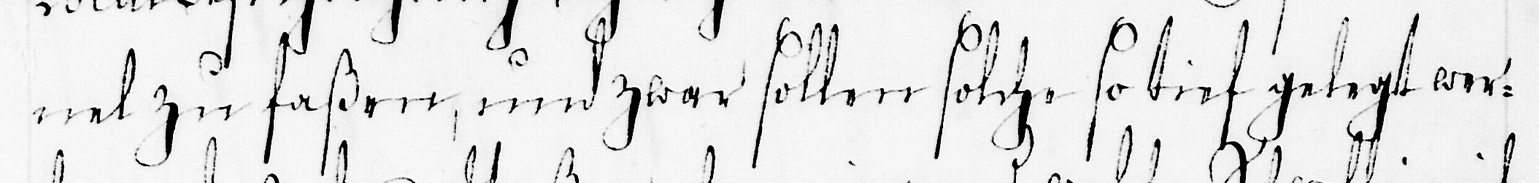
nel zu faßen, und zwar sollen solche so tief gelegt wer¬
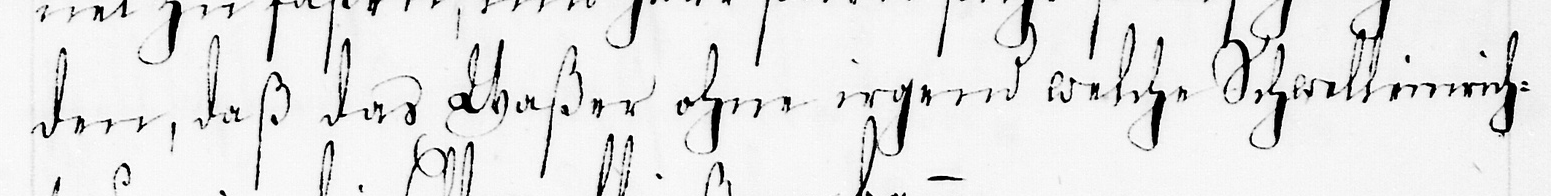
den, daß das Waßer ohne irgend welche Schwelleinrich¬
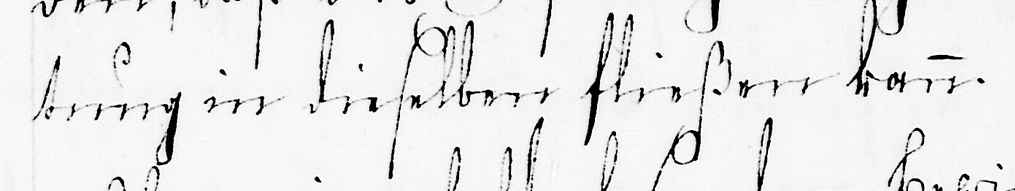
tung in dieselben fließen kann.
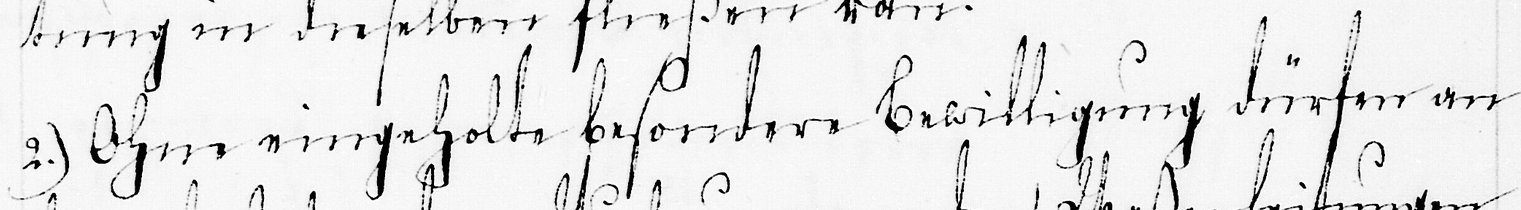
2.) Ohne eingeholte besondere Bewilligung dürfen an
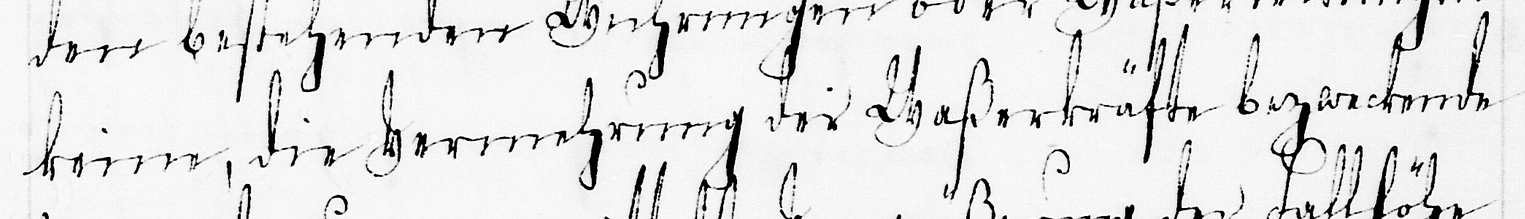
keine, die Vermehrung der Waßerkräfte bezweckende
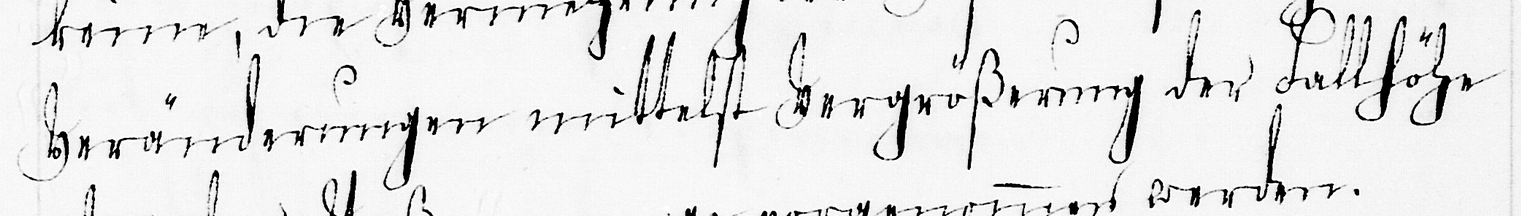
Veränderungen mittelst Vergrößerung der Fallhöhe
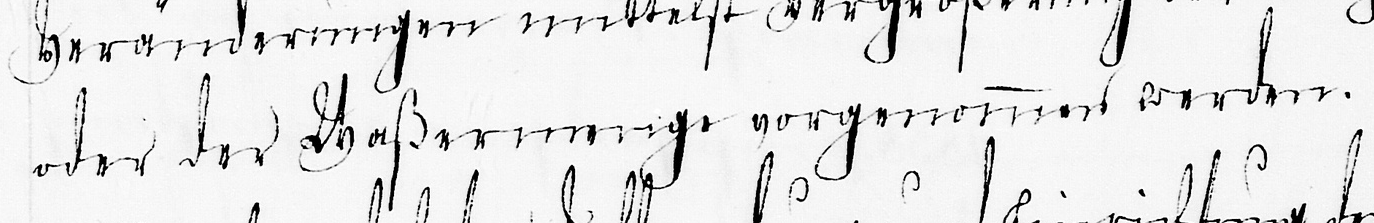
oder der Waßermenge vorgenommen werden.
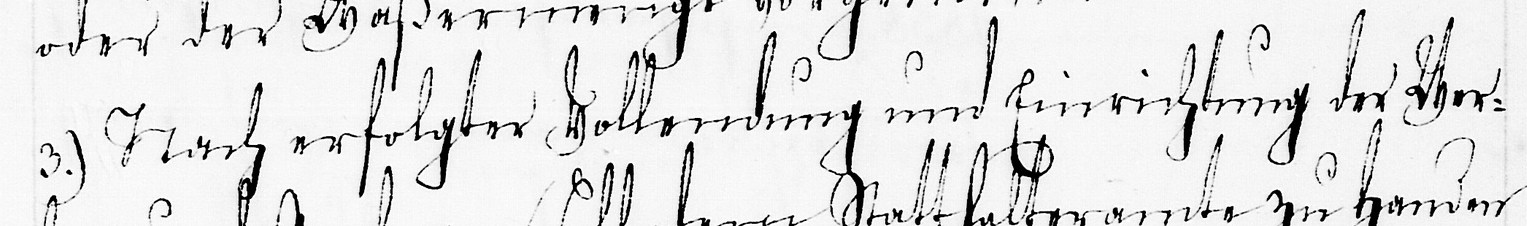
3.) Nach erfolgter Vollendung und Einrichtung der Wer¬
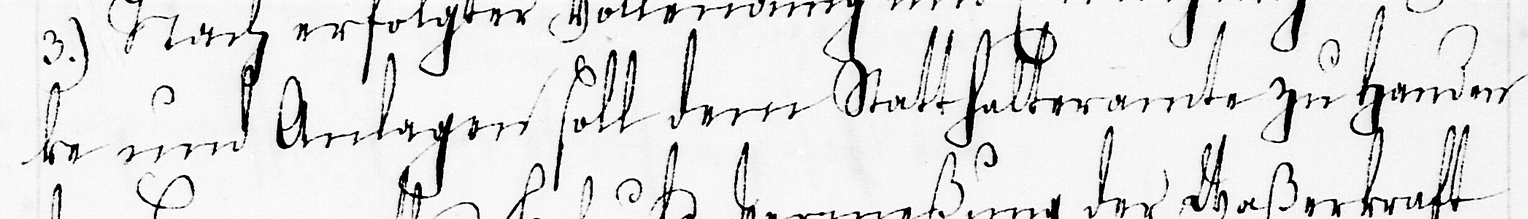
ke und Anlagen soll dem Statthalteramte zu Handen
